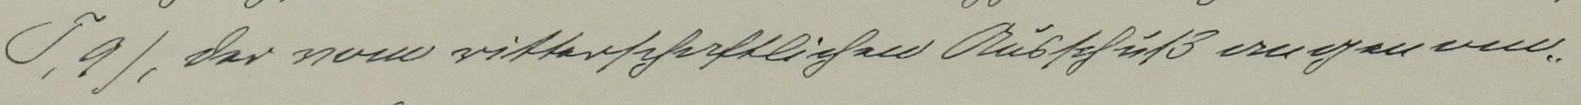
T.9), der vom ritterschaftlichen Ausschuß angenom-
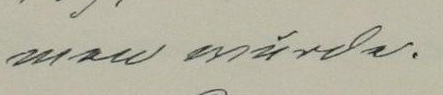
men wurde.
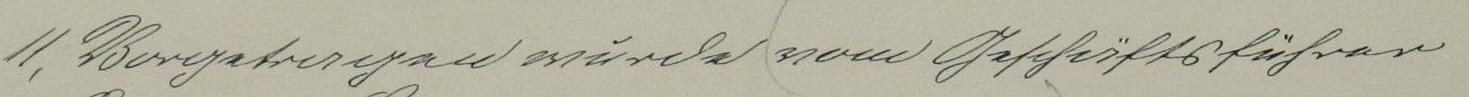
11. Vorgetragen wurde (vom Geschäftsführer
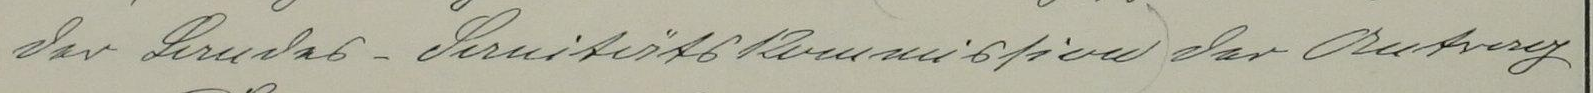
der Landes-Sanitätskommission) der Antrag
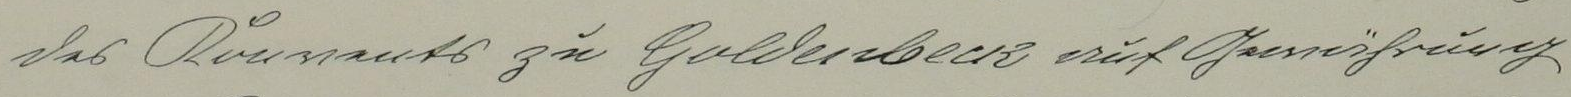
des Konvents zu Goldenbeck auf Gewährung
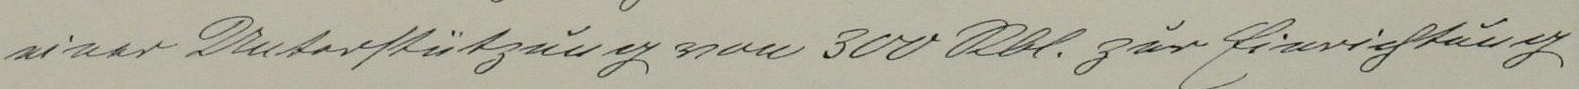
einer Unterstützung von 300 Rbl. zur Einrichtung
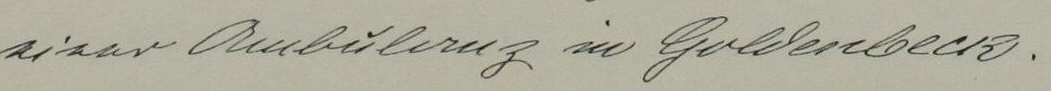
einer Ambulanz in Goldenbeck.
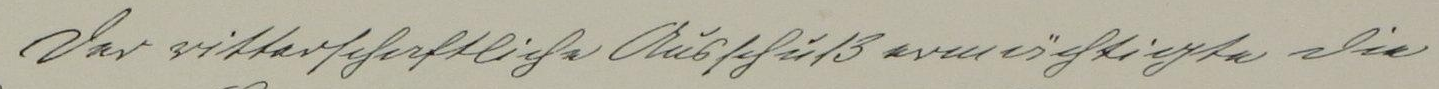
Der ritterschaftliche Ausschuß ermächtigte die
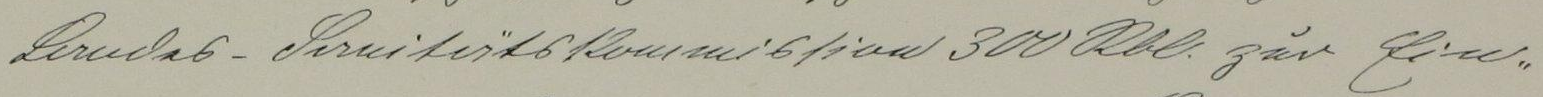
Landes-Sanitätskommission, 300 Rbl. zur Ein-
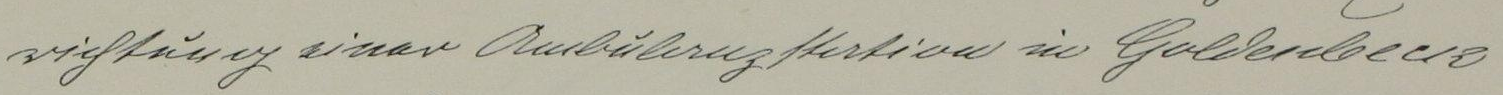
richtung einer Ambulanzstation in Goldenbeck
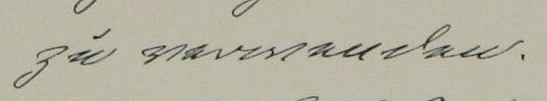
zu verwenden.
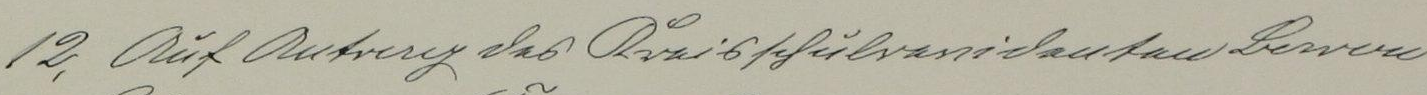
12. Auf Antrag des Kreisschulrevidenten Baron
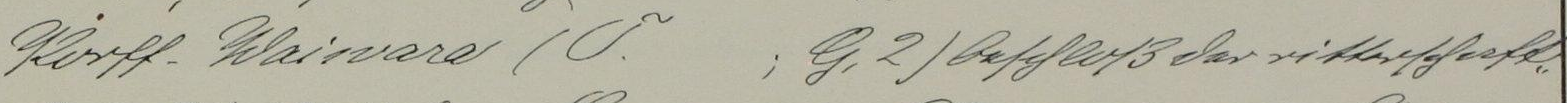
Korff-Waiwara (T. ; G.2) beschloß der ritterschaft-
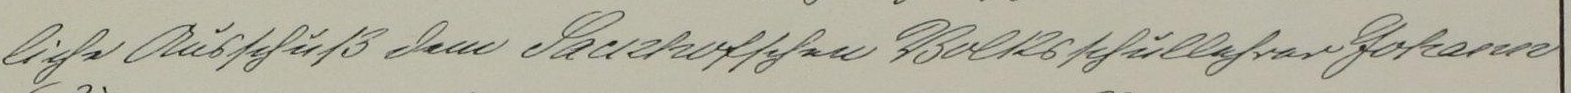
liche Ausschuß dem Sackhofschen Volksschullehrer Johann
